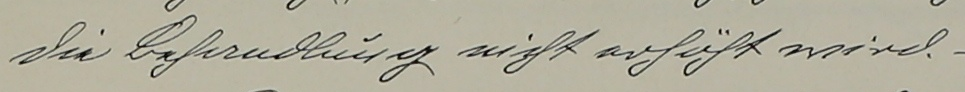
die Behandlung nicht erhöht wird.
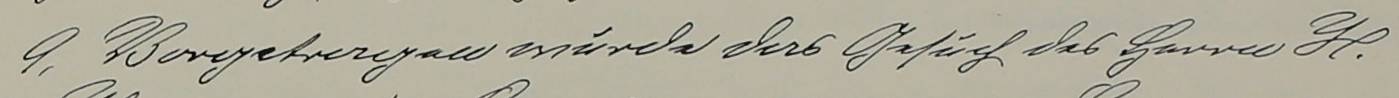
9. Vorgetragen wurde das Gesuch des Herrn H.
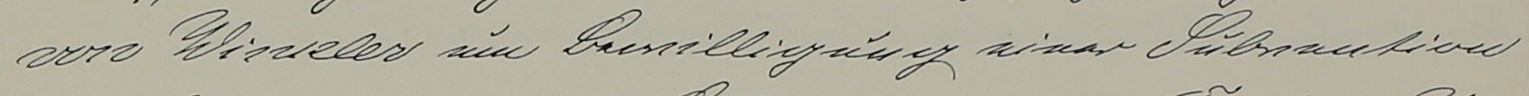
von Winkler um Bewilligung einer Subvention
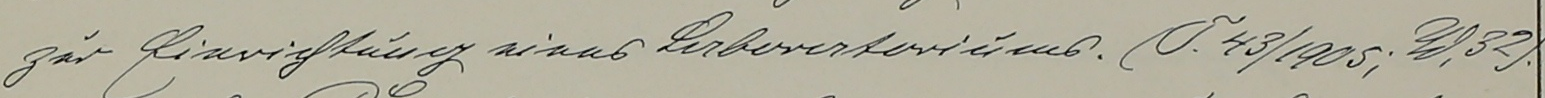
zur Einrichtung eines Laboratoriums. (T.43/1905; W.32).
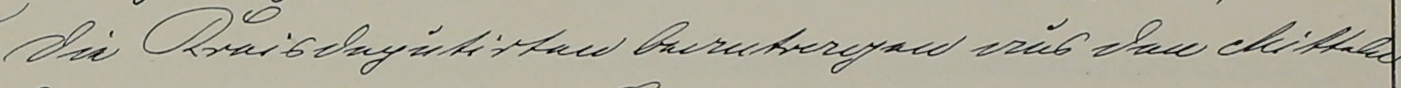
Die Kreisdeputirten beantragen aus den Mitteln
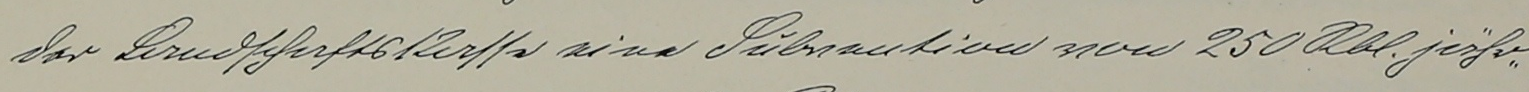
der Landschaftskasse eine Subvention von 250 Rbl. jähr-
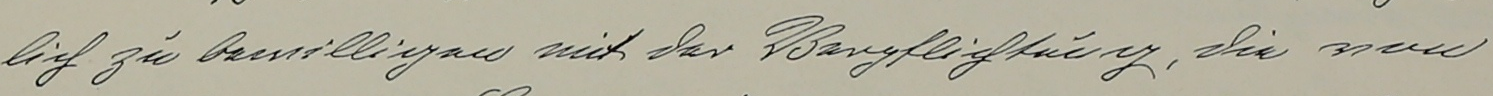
lich zu bewilligen mit der Verpflichtung, die von
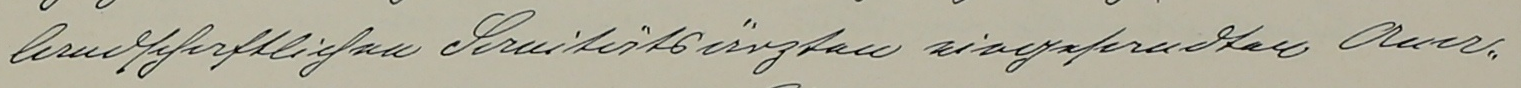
landschaftlichen Sanitätsärzten eingesandten Ana-
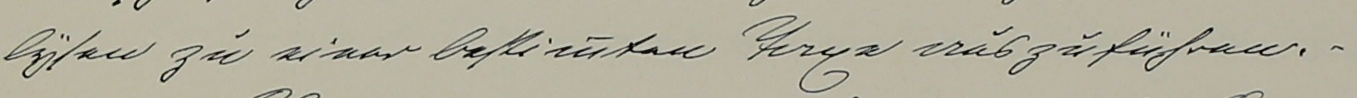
lysen zu einer bestimmten Taxe auszuführen.
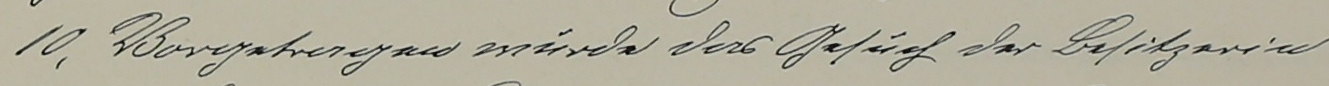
10. Vorgetragen wurde das Gesuch der Besitzerin
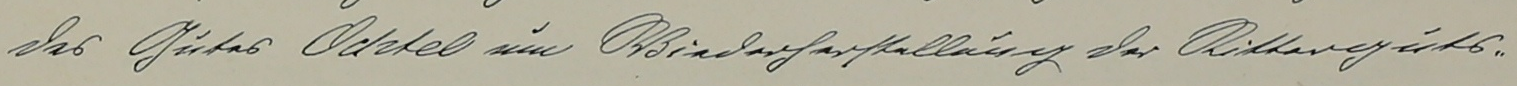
des Gutes Ochtel um Wiederherstellung der Ritterguts-
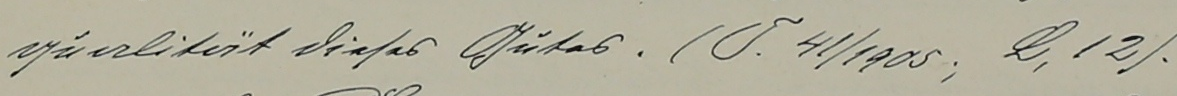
qualität dieses Gutes. (T.41/1905; L.12).
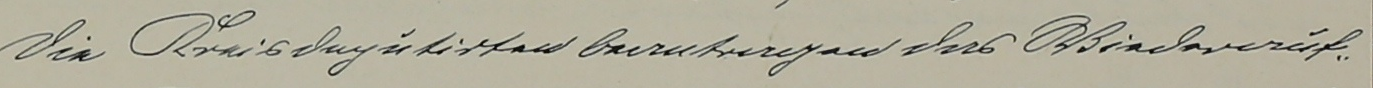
Die Kreisdeputirten beantragen, das Wiederauf-
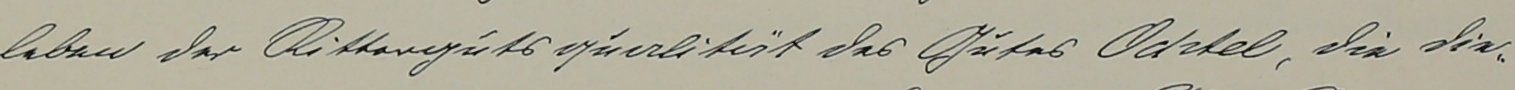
leben der Rittergutsqualität des Gutes Ochtel, die die-
